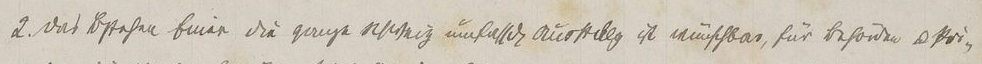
2. Das Bstehen Einer die ganze Schweiz umfassden Ausstellg ist wünschbar, für Behörden u Pri-
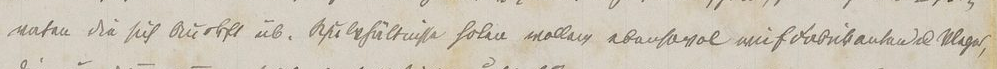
vaten die sich Auskft üb. Schulvhältnisse holen wollen, ebensowol wie f Fabrikanten u Vleger,
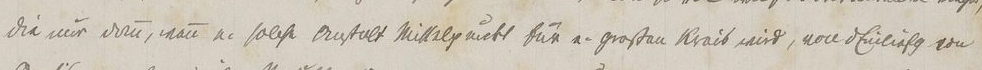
die nur dann, wenn e. solche Anstalt Mittelpunkt für e. großen Kreis wird, von d Einliefg von
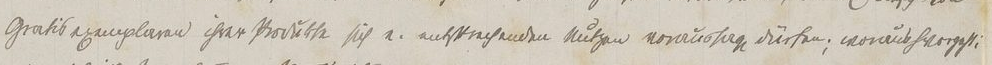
Gratisexemplaren ihrer Produkte sich e. entsprechenden Nutzen voraussagen dürfen; woraus hrvrgeht,
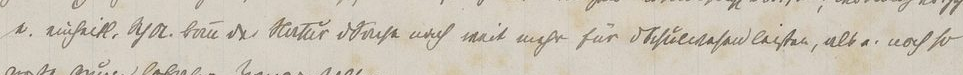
e. einheitl. SchA. kann der Natur d Sache nach weit mehr für d Schulwesen leisten, als e. noch so
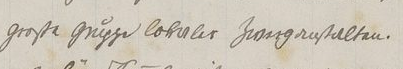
große Gruppe lokaler Zweiganstalten.
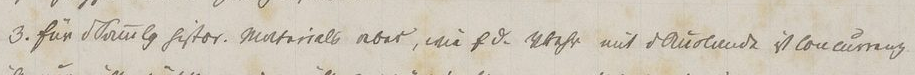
3. für d Sammlg histor. Materials aber, wie f d. Vkehr mit d Auslande ist Concurrenz
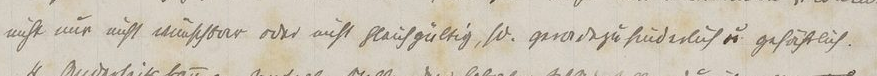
nicht nur nicht wünschbar oder nicht gleichgültig, sd. geradezu hinderlich u. gefährlich.
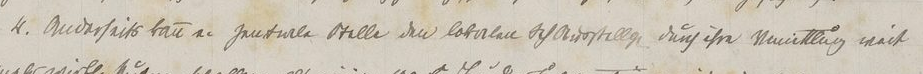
4. Anderseits kann e. zentrale Stelle den lokalen SchAusstellgen durch ihre Vmittlung weit
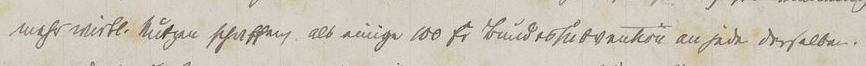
mehr wirkl. Nutzen schaffen, als einige 100 fr Bundessubvention an jede derselben.
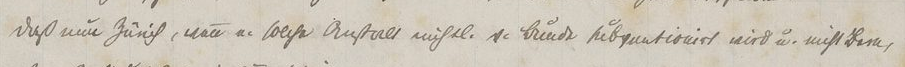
Daß nun Zürich, wenn e. solche Anstalt einhtl. v. Bunde subventionirt wird u. nicht Bern,
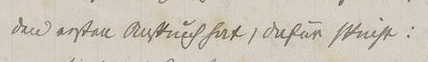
den ersten Anspruch hat, dafür spricht:
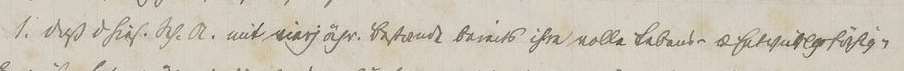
1. daß d hies. Sch.A. mit vierjähr. Bestande bereits ihre volle Lebens- u Entwicklgsfähig-
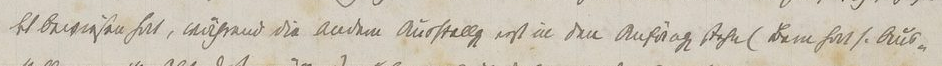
kt bewiesen hat, während die andern Ausstellgen erst in den Anfängen stehn (Bern hat s. Aus-
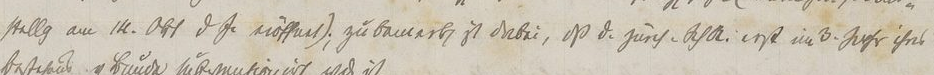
stellg am 14. Okt dJ. eröffnet); zu bemerken ist dabei, dß d. zürch. SchA. erst im 3. Jahr ihres
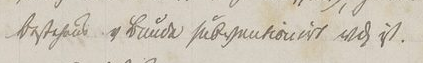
Bestehens v. Bunde subventionirt wden ist.
